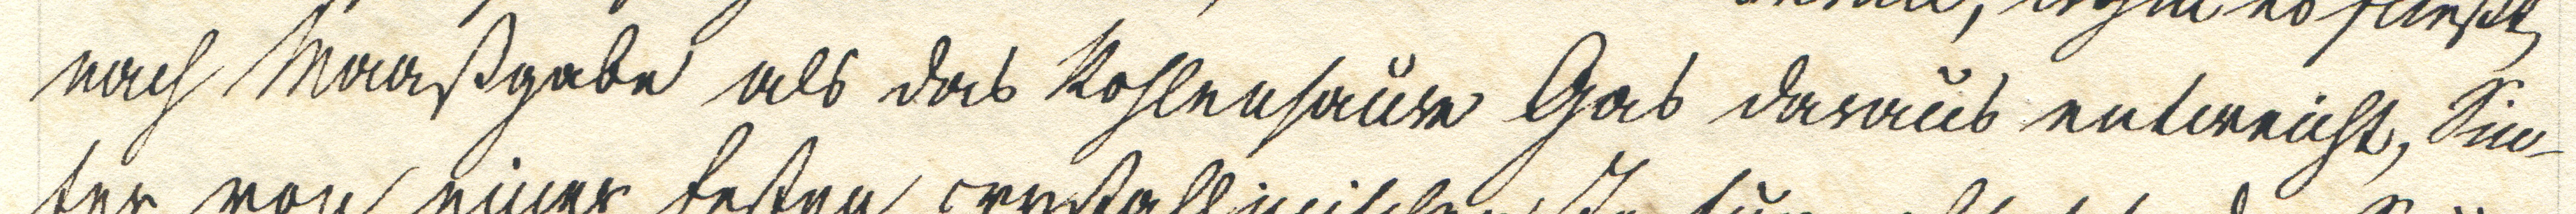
nach Maaßgabe als das kohlensaure Gas daraus entweicht, Sin-
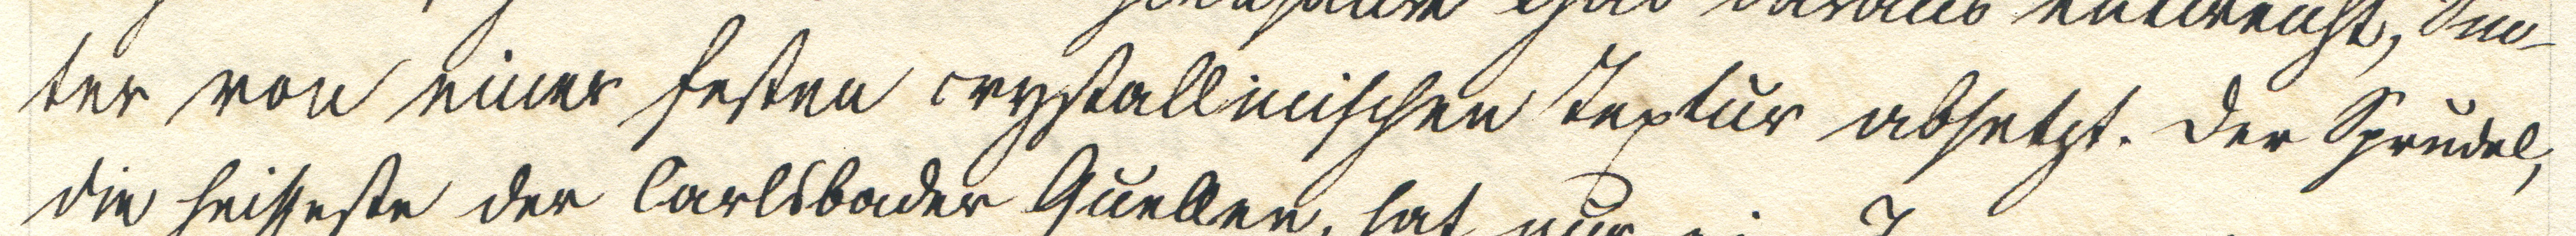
ter von einer festen crystallinischen Textur absetzt. Der Sprudel,
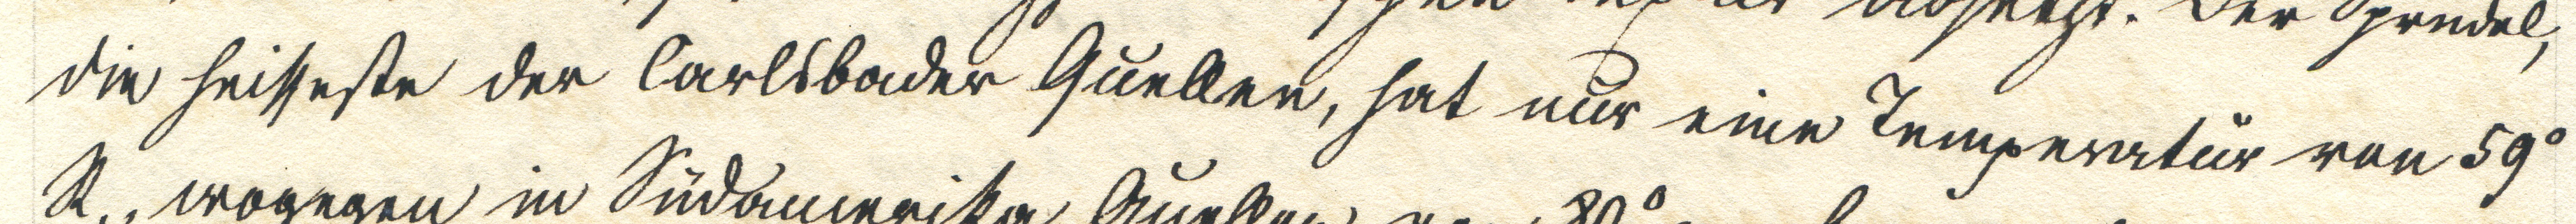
die heisseste der Carlsbader Quellen, hat nur eine Temperatur von 59°
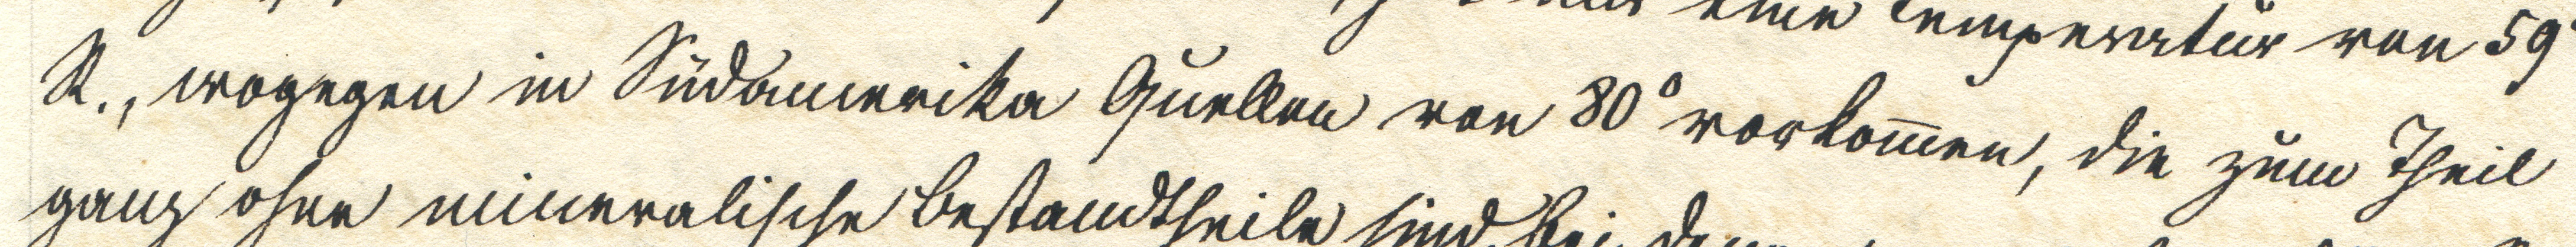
R., wogegen in Südamerika Quellen von 80° vorkom̃en, die zum Theil
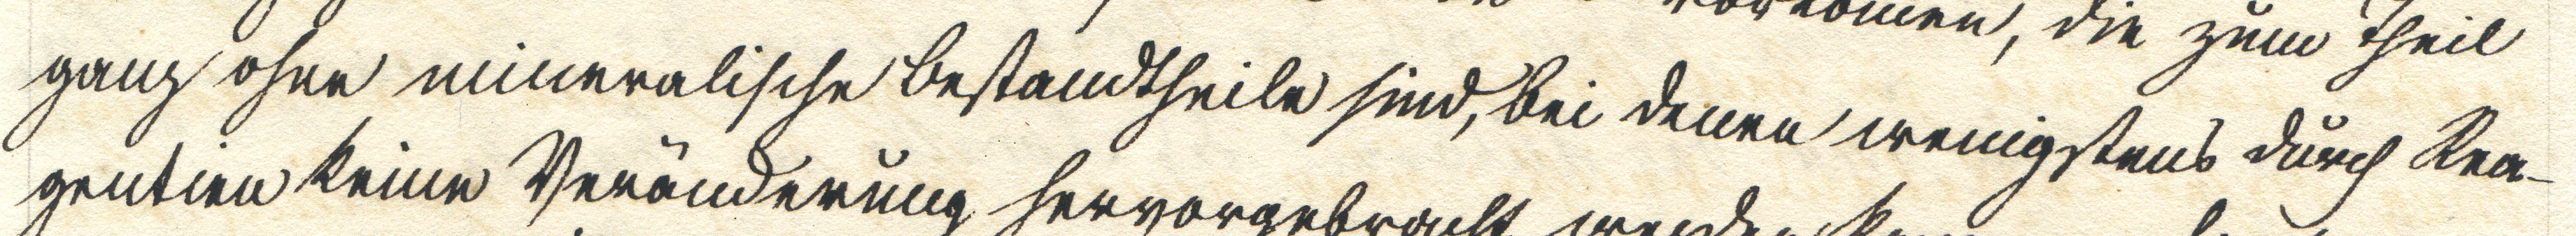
ganz ohne mineralische Bestandtheile sind, bei denen wenigstens durch Rea-
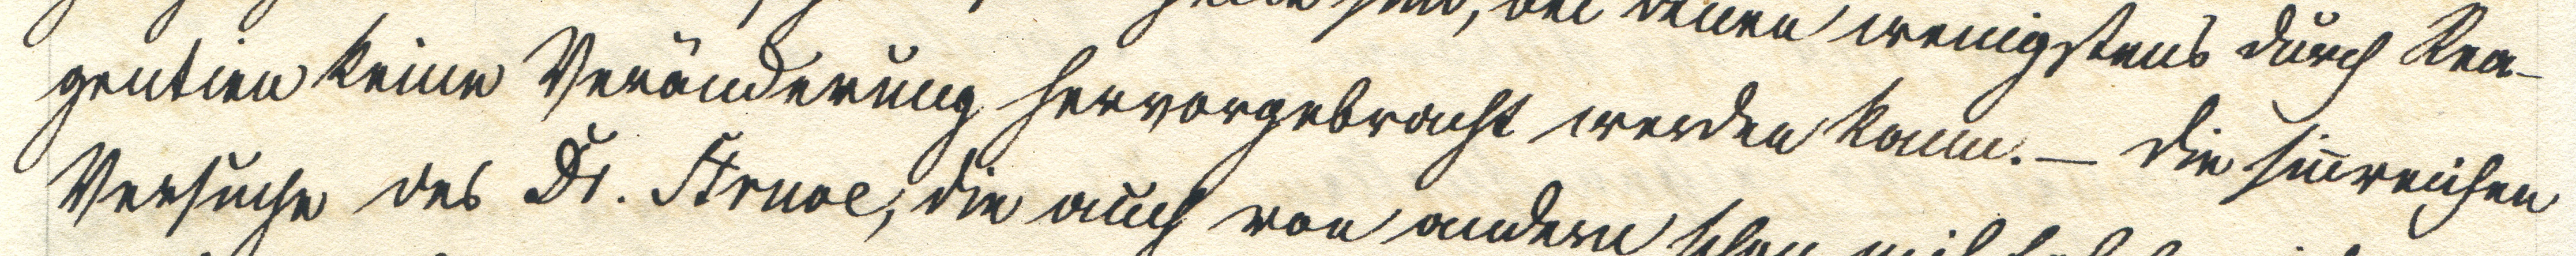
gentien keine Veränderung hervorgebracht werden kann. – Die siñreichen
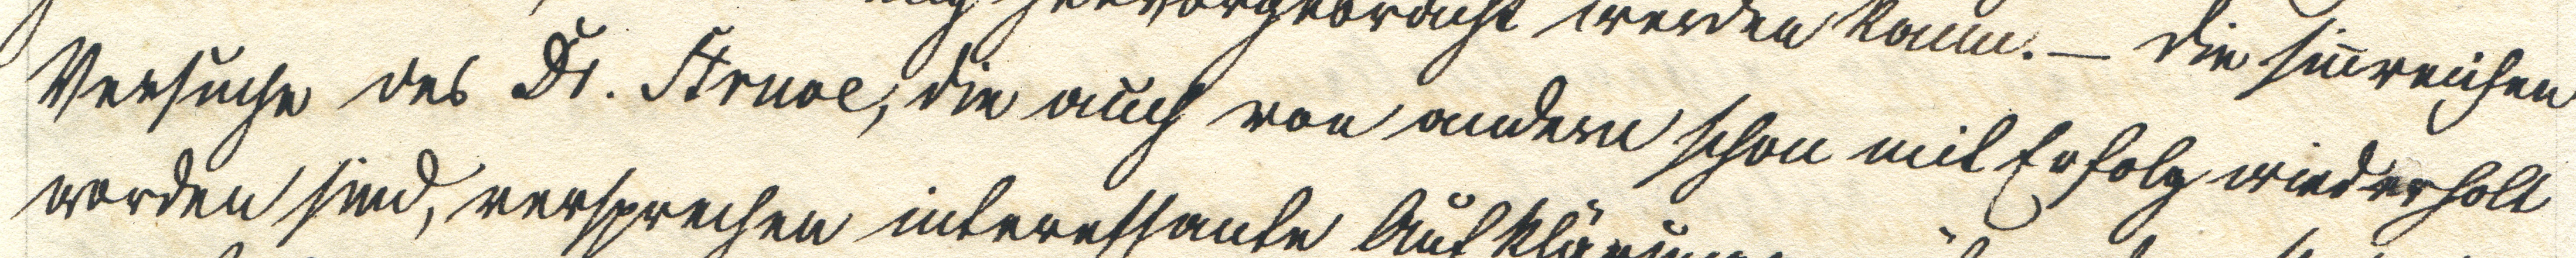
Versuche des Dr. Struve, die auch von andern schon mit Erfolg wiederholt
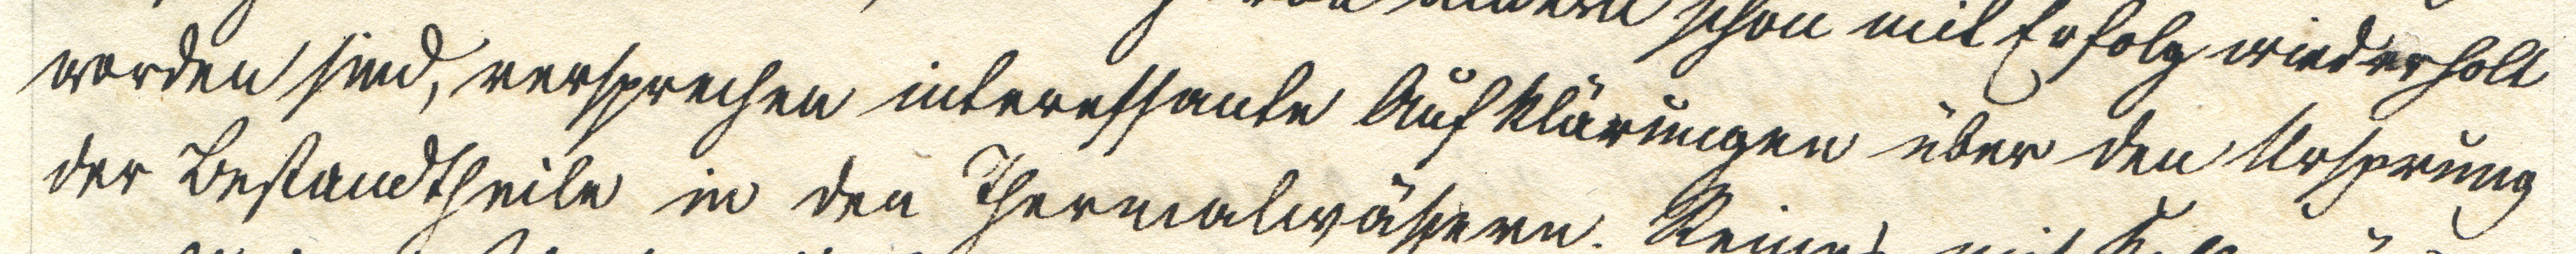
worden sind, versprechen interessante Aufklärungen über den Ursprung
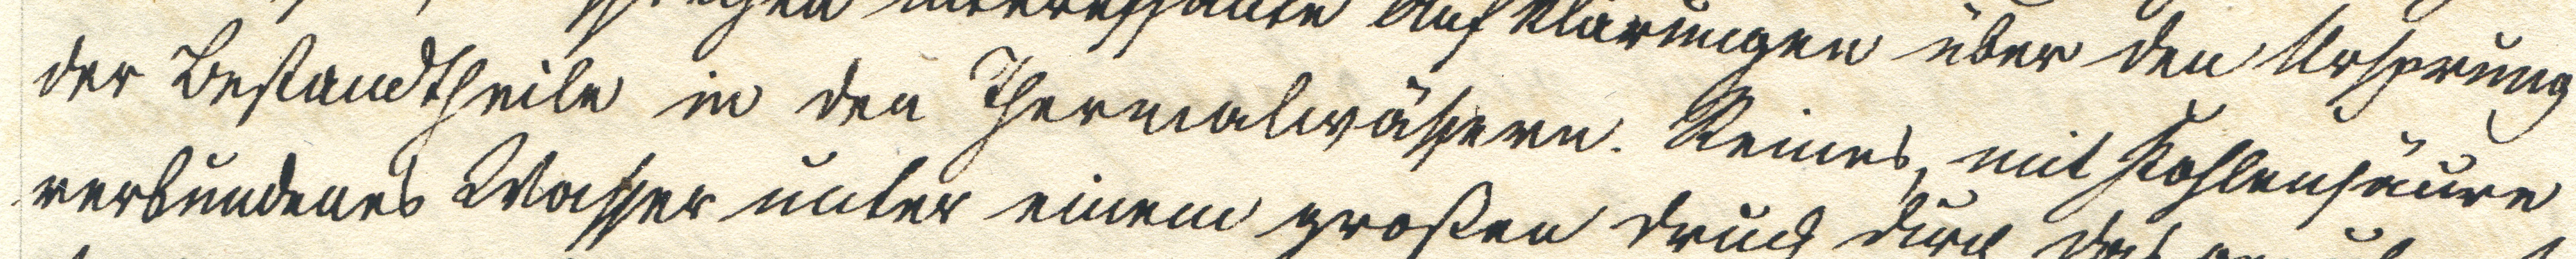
der Bestandtheile in den Thermalwässern. Reines, mit Kohlensäure
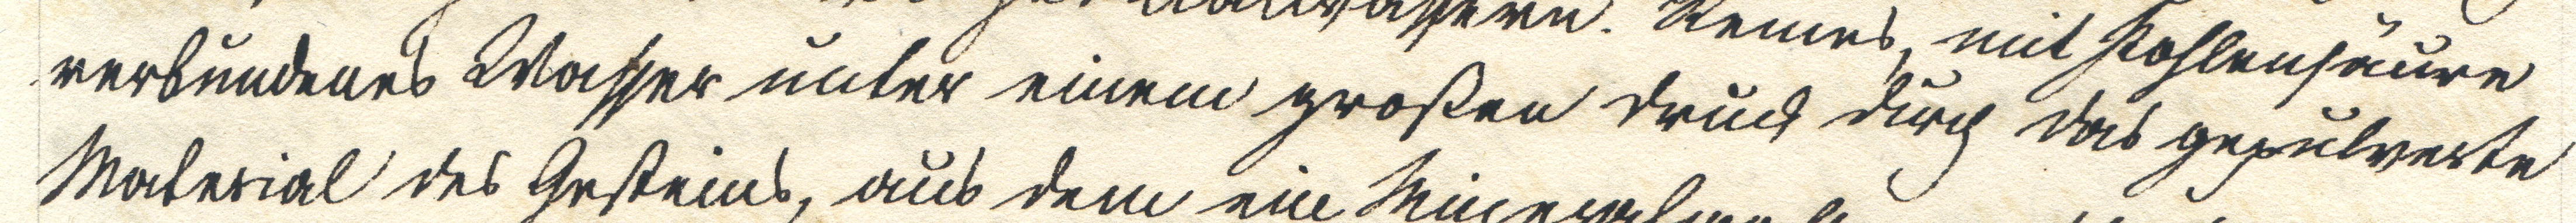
verbundenes Wasser unter einem großen Druck durch das gepulverte
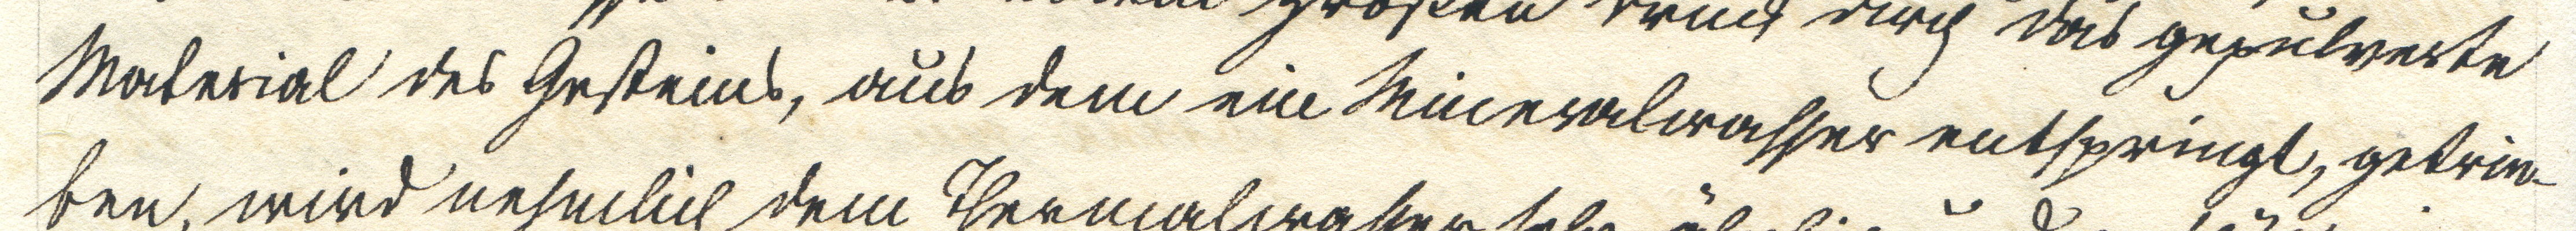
Material des Gesteins, aus dem ein Mineralwasser entspringt, getrie-
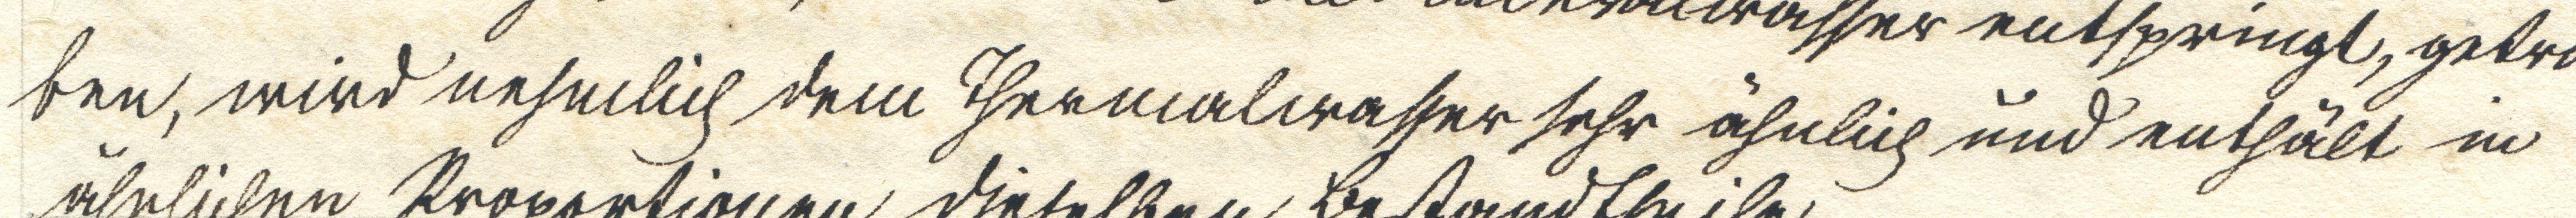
ben, wird nehmlich dem Thermalwasser sehr ähnlich und enthält in
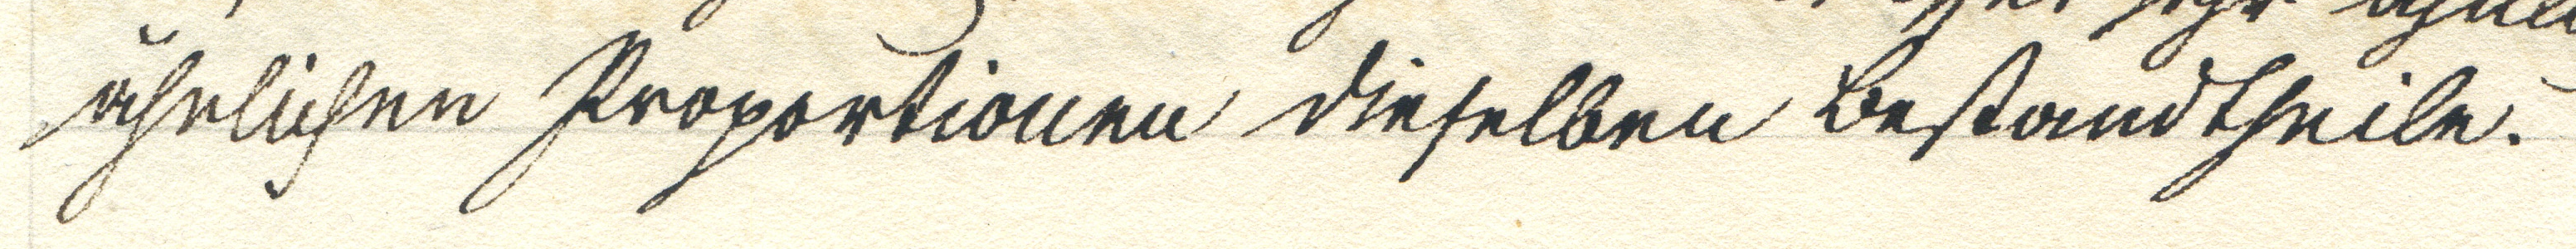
ähnlichen Proportionen dieselben Bestandtheile.
